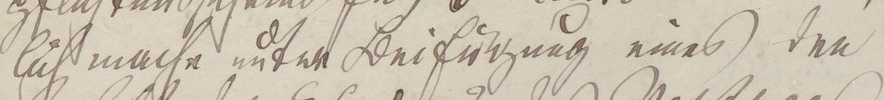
lich mache unter Beifügung eines den
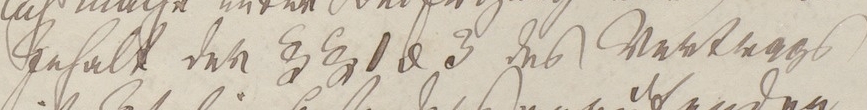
Inhalt der §§ 1 & 3 des Vertrags
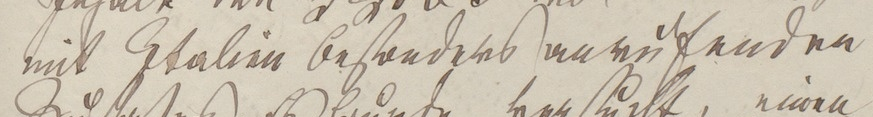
mit Italien besonders anrufenden
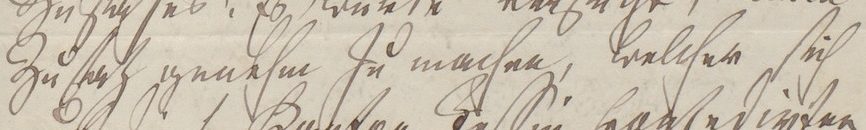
Zusatz genehm zu machen, welcher sich
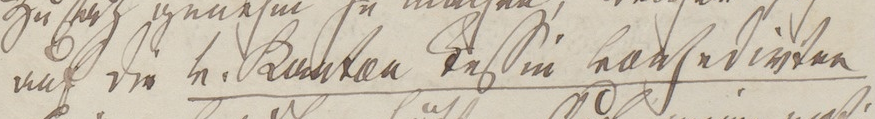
auf die v. Kanton Tessin konzedirten
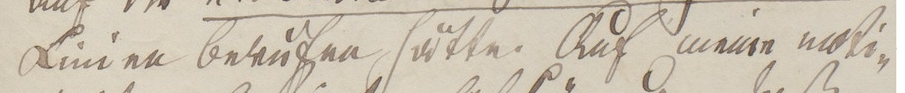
Linien berufen hätte. Auf meine moti-
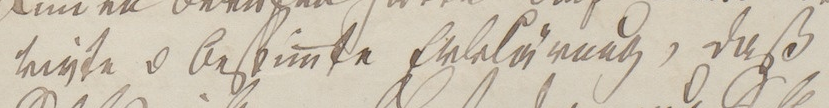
virte & bestimmte Erklärung, daß
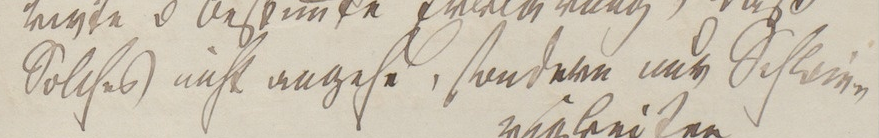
Soches nicht angehe, sondern nur Schwie-
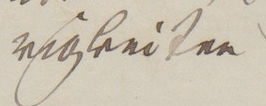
rigkeiten
